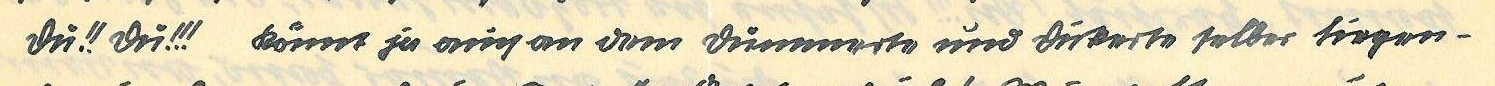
Du!! Du!!! Könnt ja auch an dem Dummerle und Dickerle selber liegen –
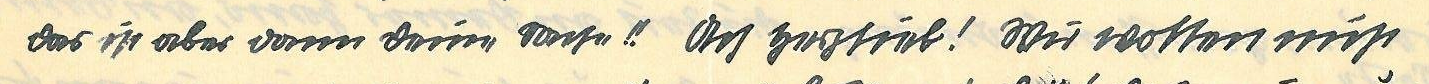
das ist aber dann Deine Sache!! Ach Herzlieb! Wir wollen nicht
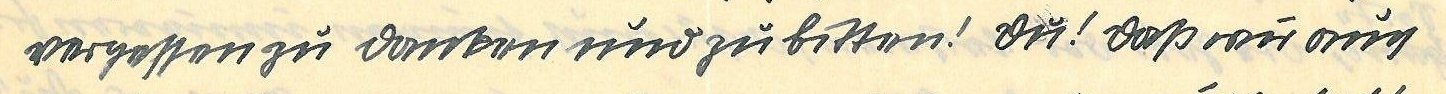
vergessen zu danken und zu bitten! Du! Daß wir auch
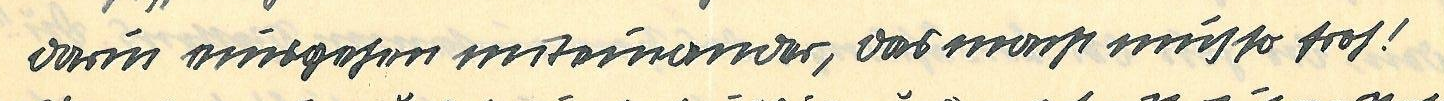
darin einsgehen miteinander, das macht mich so froh!
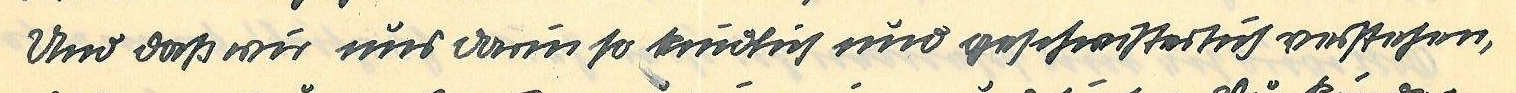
Und daß wir uns darin so kindlich und geschwisterlich verstehen,
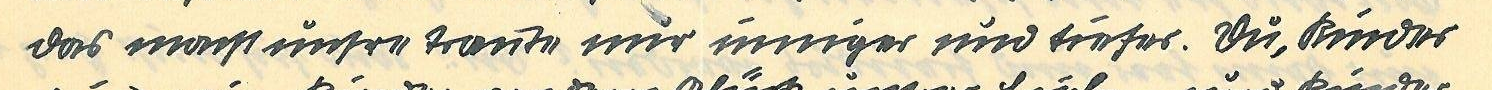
das macht unsre Traute nur inniger und tiefer. Du, Kinder
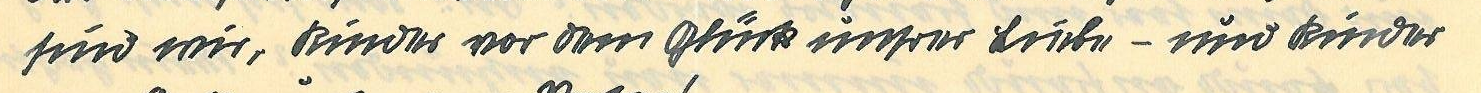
sind wir, Kinder vor dem Glück unsrer Liebe – und Kinder
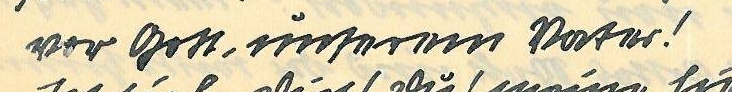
vor Gott, unserem Vater!
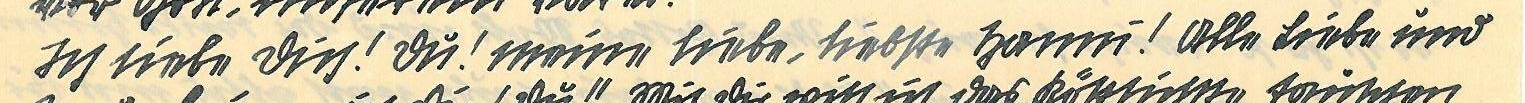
Ich liebe dich! Du! Meine liebe, liebste! Alle Liebe und
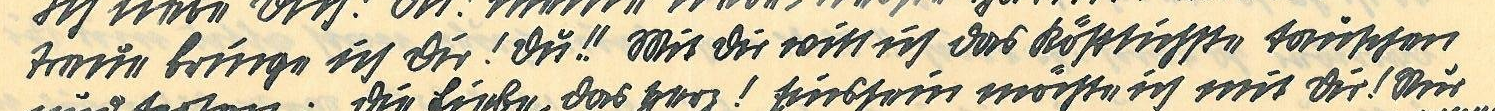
Treue bringe ich Dir! Du!! Mit Dir will ich das Köstlichste tauschen
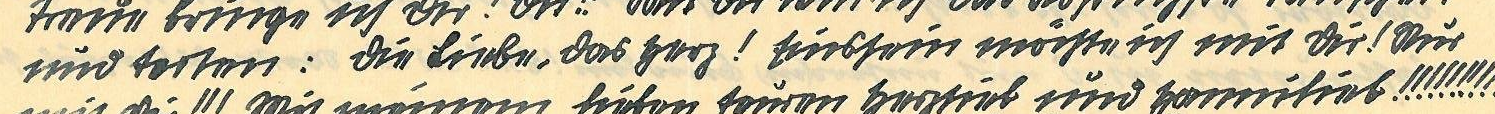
und teilen: die Liebe, das Herz! Einssein möchte ich mit Dir! Nur
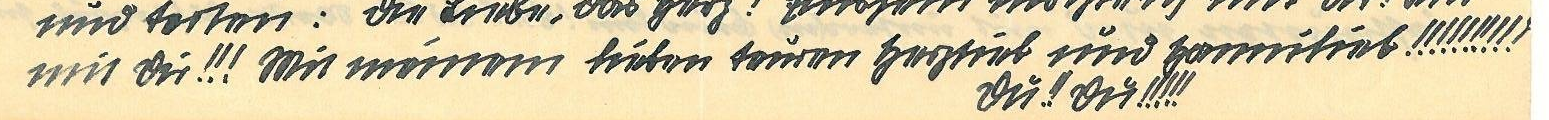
mit Dir!!! Mit meinem lieben teuren Herzlieb und lieb!!!!!!!!!!
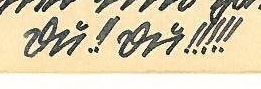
Du!! Du!!!!!
